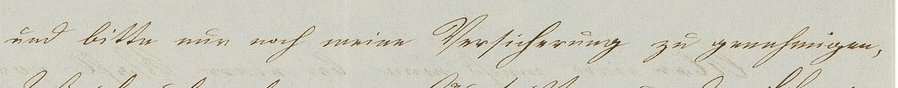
und bitte nun noch meine Versicherung zu genehmigen,
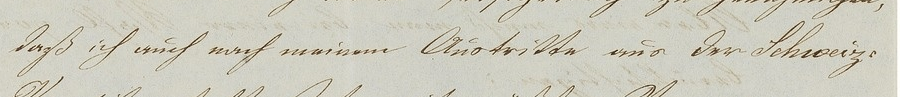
daß ich auch nach meinem Austritte aus der Schweiz:
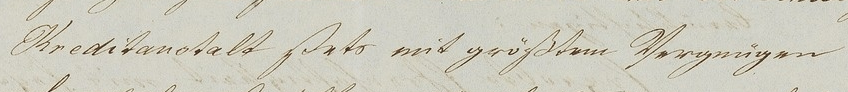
Kreditanstalt stets mit größtem Vergnügen
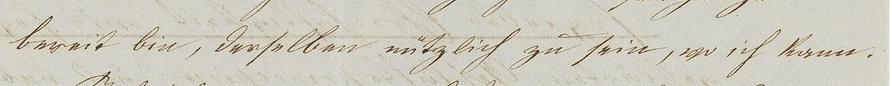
bereit bin, derselben nützlich zu sein, wo ich kann.
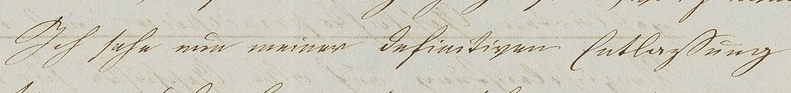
Ich sehe nun meiner definitiven Entlassung
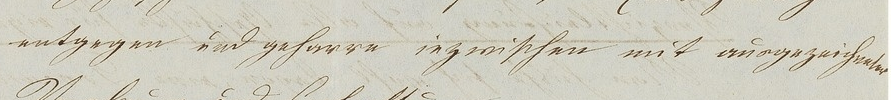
entgegen und geharre inzwischen mit ausgezeichneter
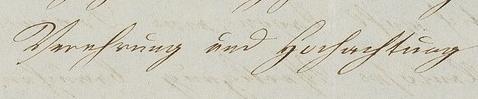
Verehrung und Hochachtung
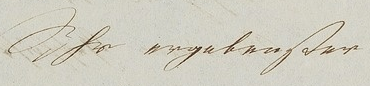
Ihr ergebenster
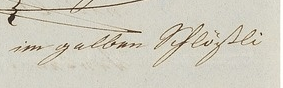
im gelben Schlößli
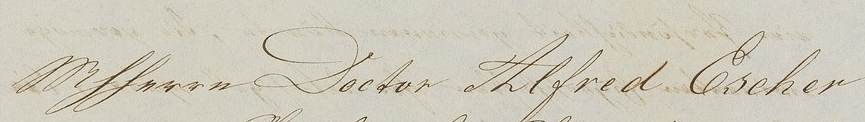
Mhherrn Doctor Alfred Escher
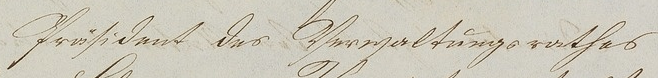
Präsident des Verwaltungsrathes
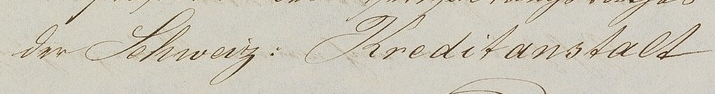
der Schweiz: Kreditanstalt
